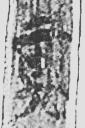奠
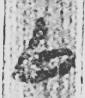㠯（以）
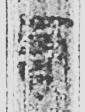{㠯ㅋ}
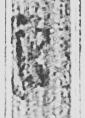政
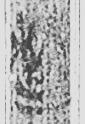楚
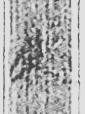文
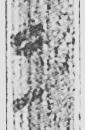王
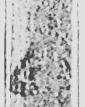㠯（以）
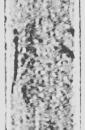啟
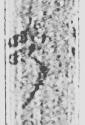于
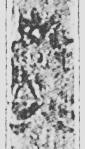灘
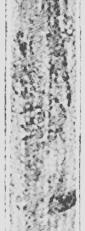{㫃昜}
